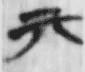亓（其）
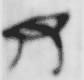尹
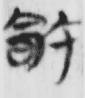○（令）
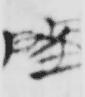陵
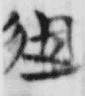○（卜）
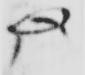尹
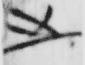之
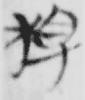相
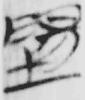○（陽）
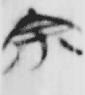余
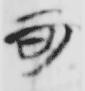可
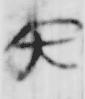內
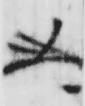之
